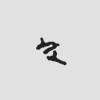既
